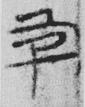○（需）
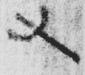又（有）
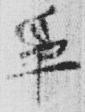孚
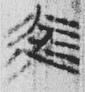光
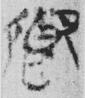卿（亨）
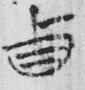貞
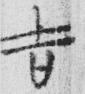吉
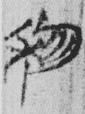利
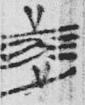涉
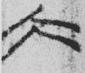大
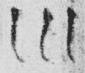川
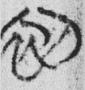初
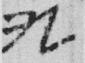九
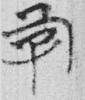○（需）
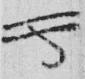于
